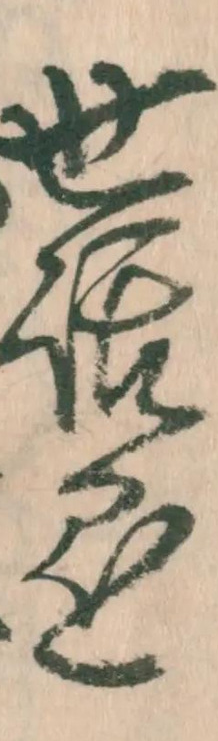世話懸
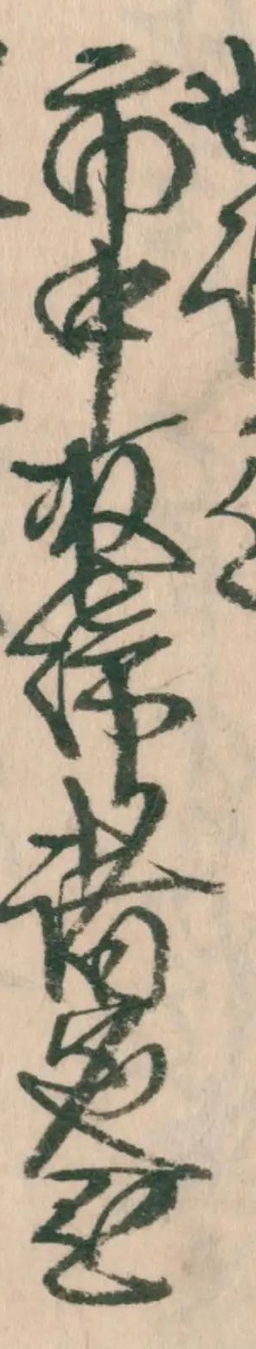市中取締り諸色懸
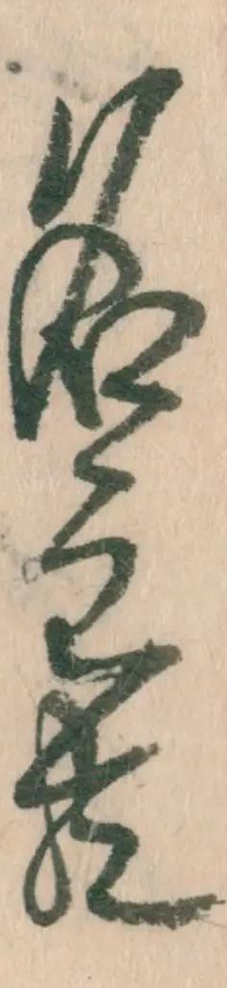名主共
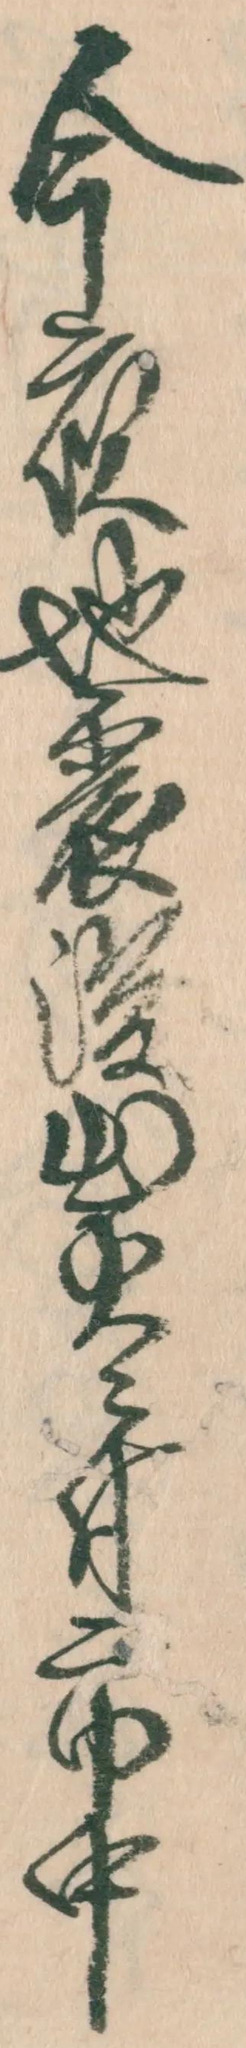今夜地震後出火ニ付市中
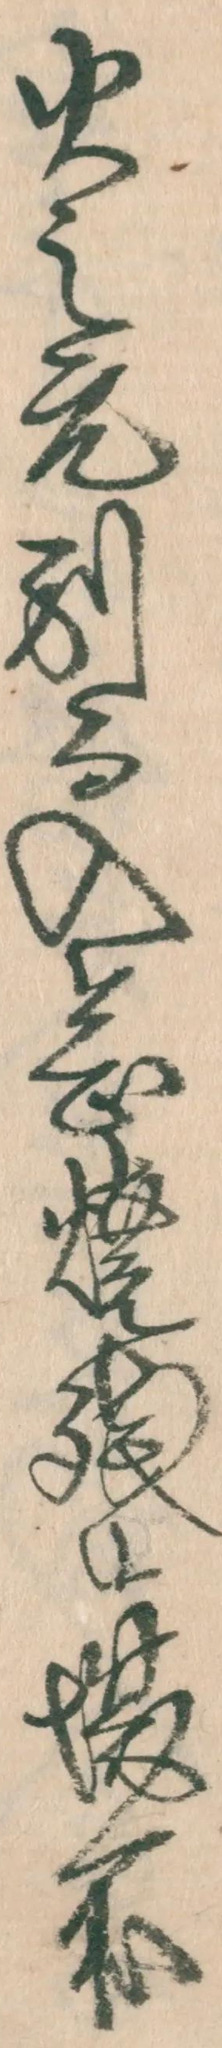火之元別て入念焼残候場所
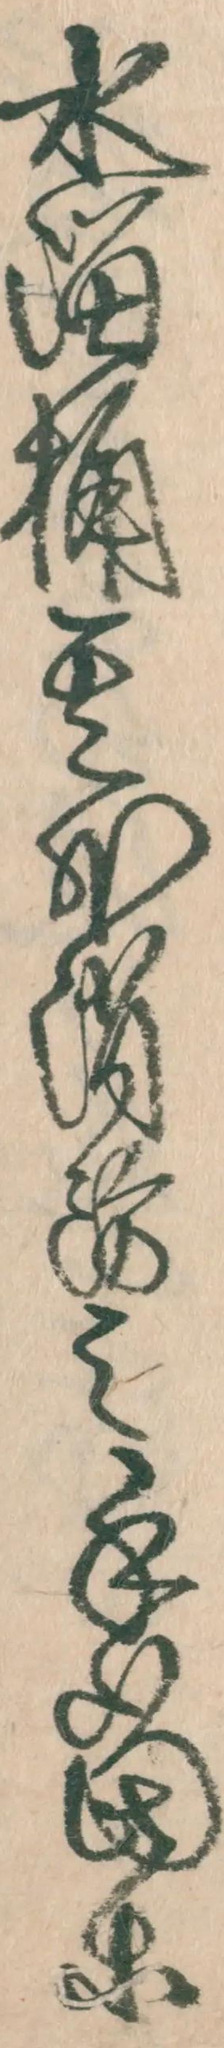水溜桶其外消防之手当等

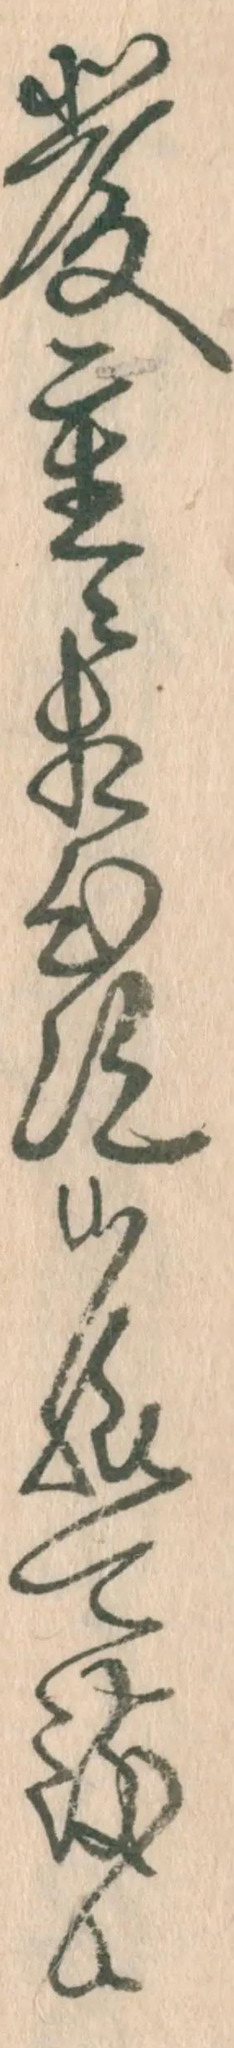厳重ニ相心得候様可致候
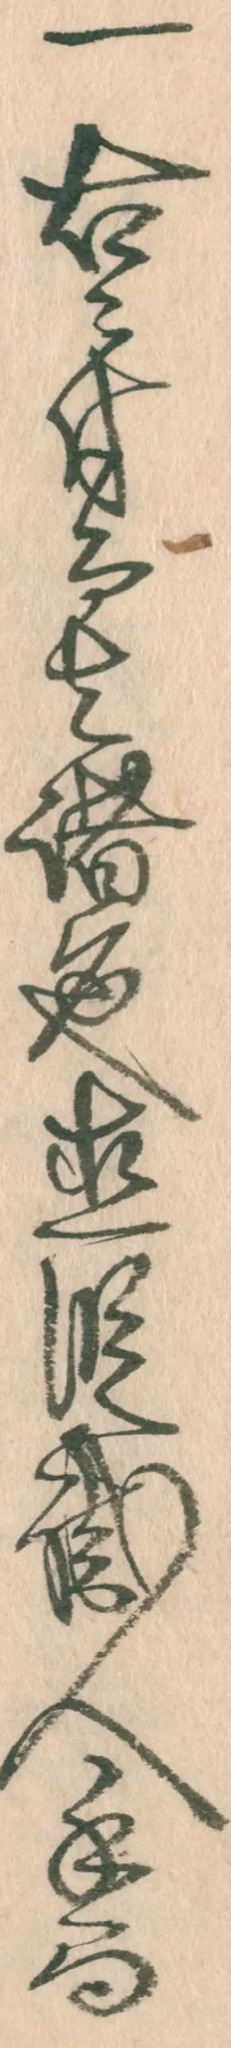一右ニ付ては諸色直段職人手間
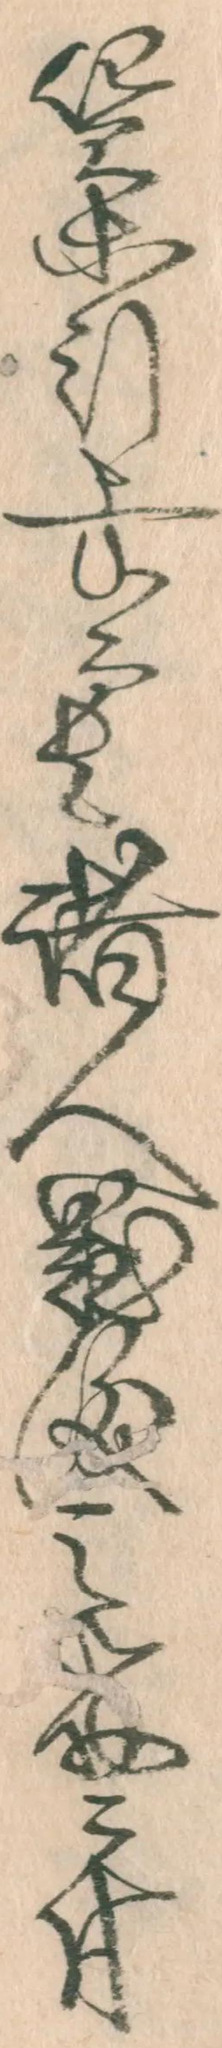賃等引上候ては諸人難儀之筋ニ付
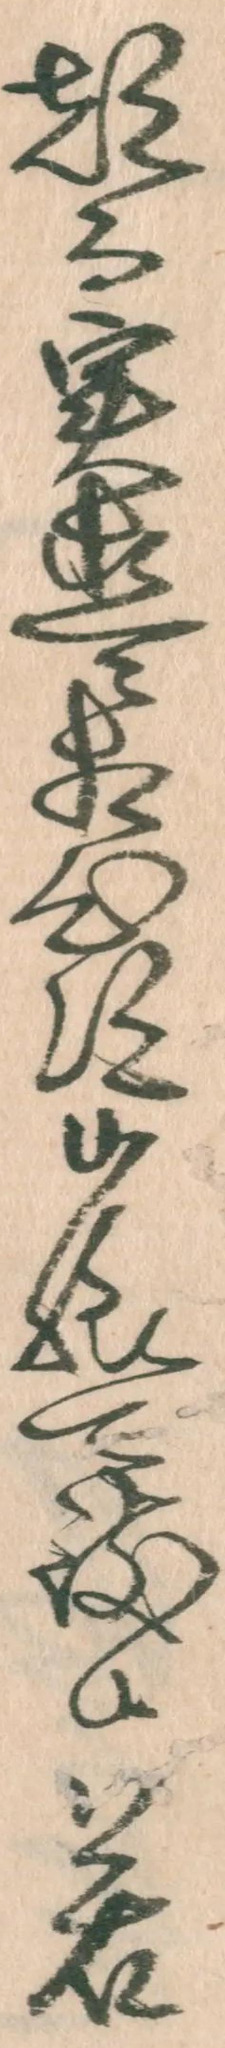都て実直ニ相心得候様可被致候若
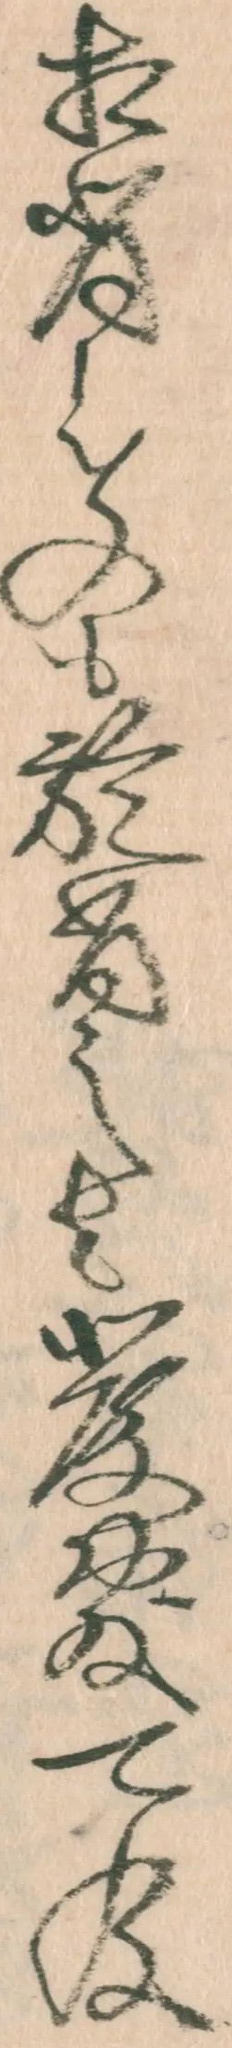相背候ものも於有之は厳敷可及
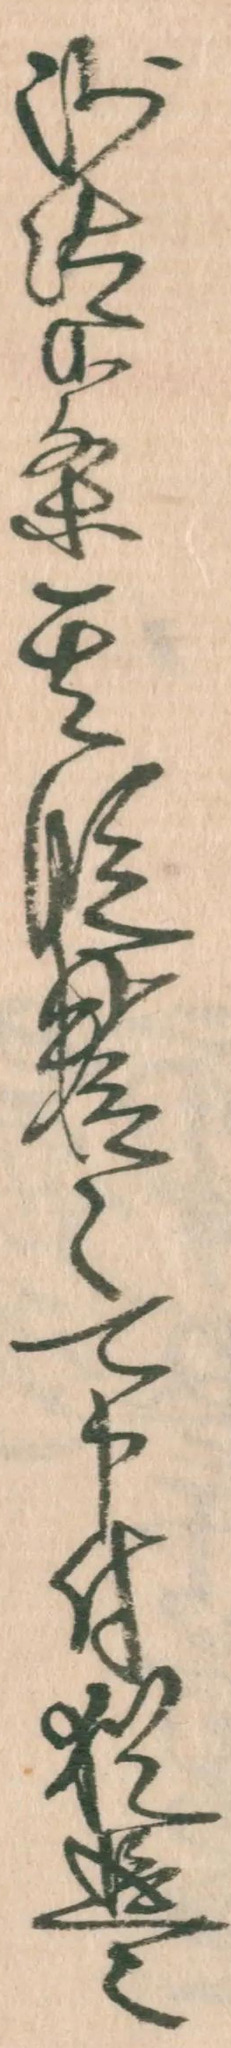沙汰候条其段精〻可申付猶追〻
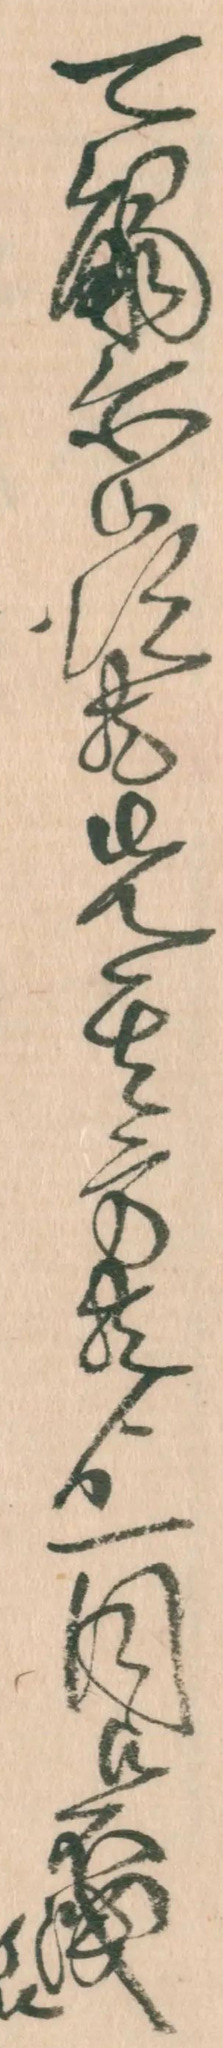可触示候得共先其方共ゟ一同え不洩様
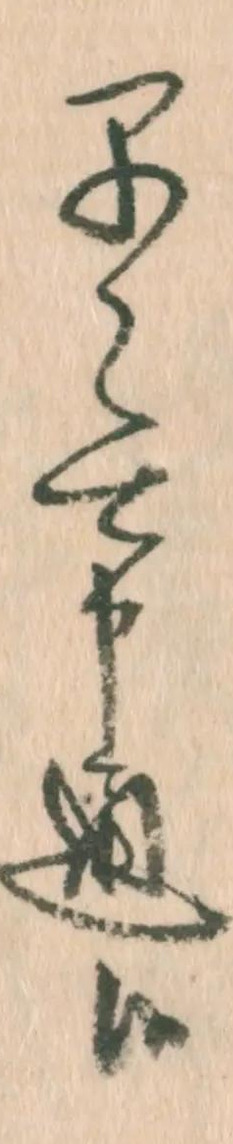早〻可申通候
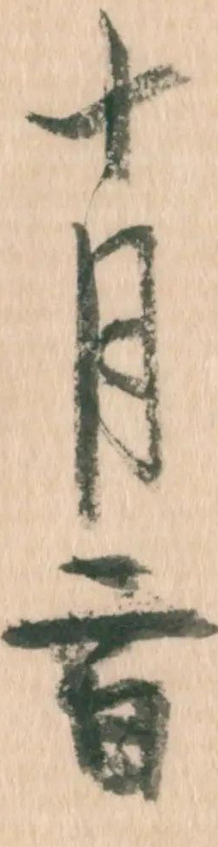十月二日

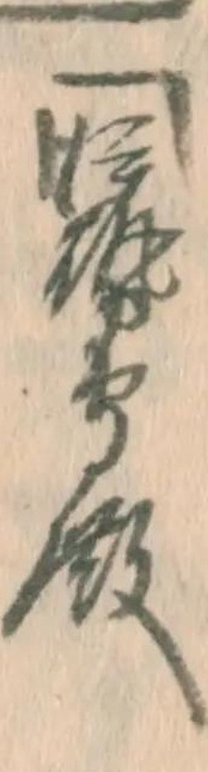│[伊㔟守殿
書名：地震災書留 2巻. [2] 内表紙に「地震一件　安政二卯年十月」とあり
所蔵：国立国会図書館 National Diet Library, JAPAN
